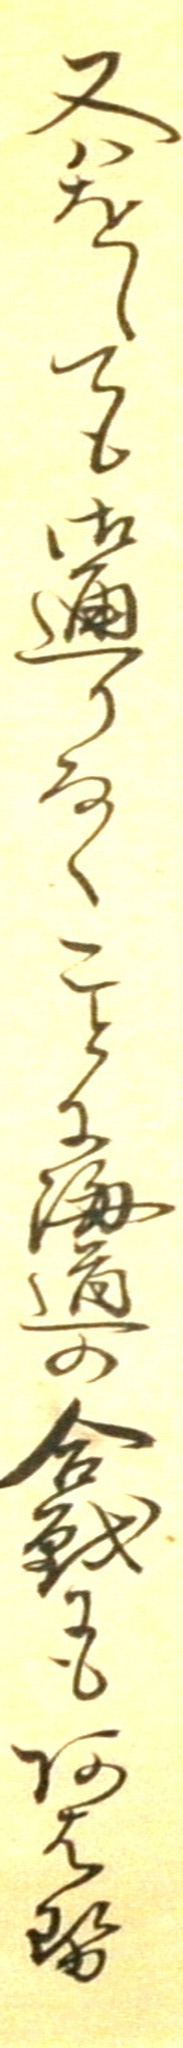又はをしても御通りなくことに海道の合戦にもあはせ
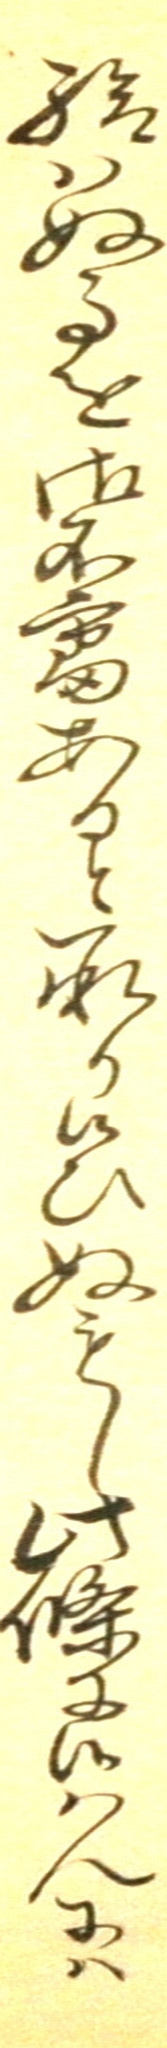給はぬ事を御不審あると承り候ひぬもし此条に候はんには
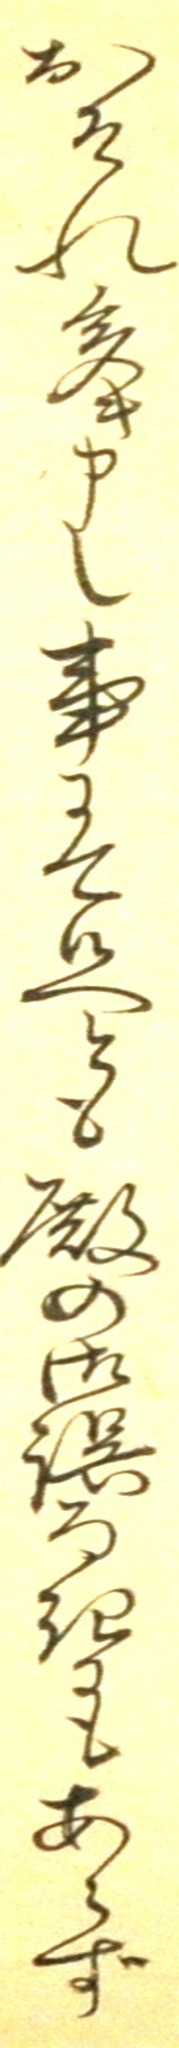おそれ多き申し事にて候へとも殿の御誤なきにもあらず
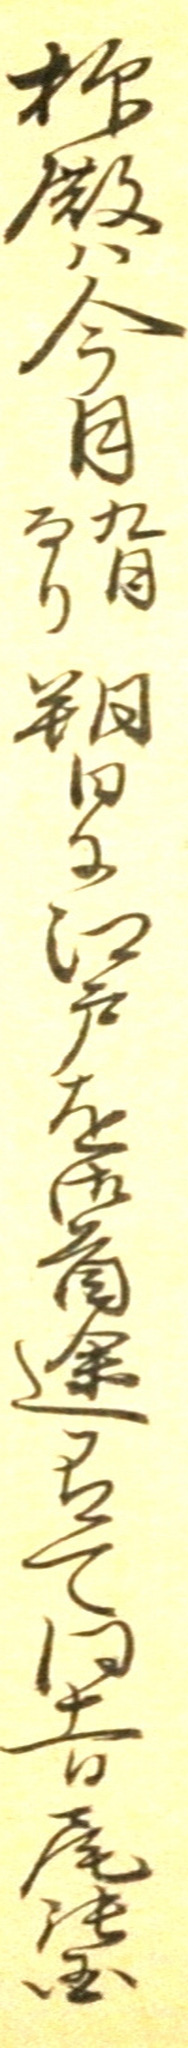抑殿は今月九月なり朔日に江戸を御首途有て同十一日尾張国
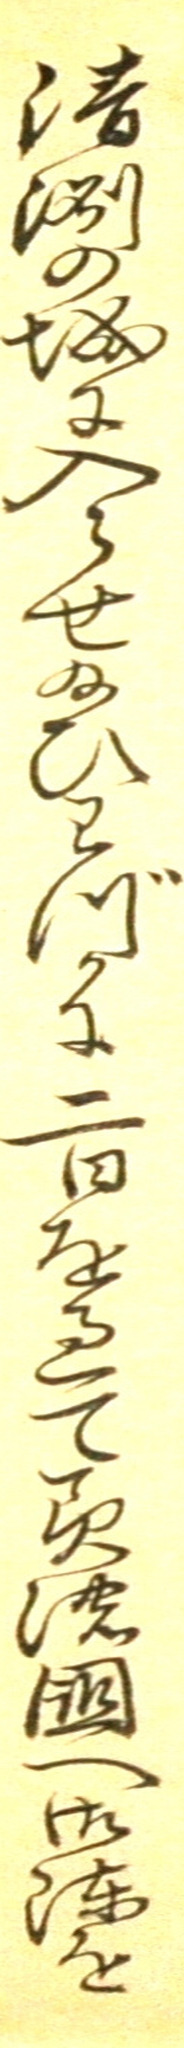清洲の城に入らせ給ひわづかに二日を過て美濃国へ御陣を
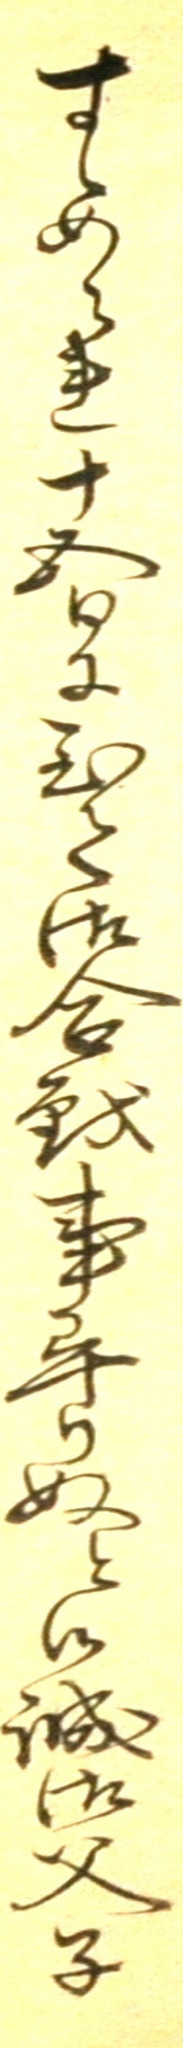すゝめられ十五日に至て御合戦事畢りぬと候誠御父子
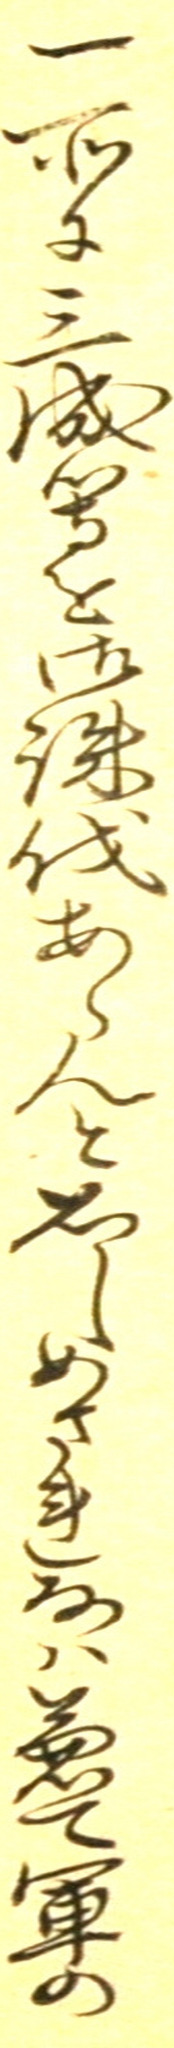一所に三成等を御誅伐あらんと思しめされなは兼て軍の

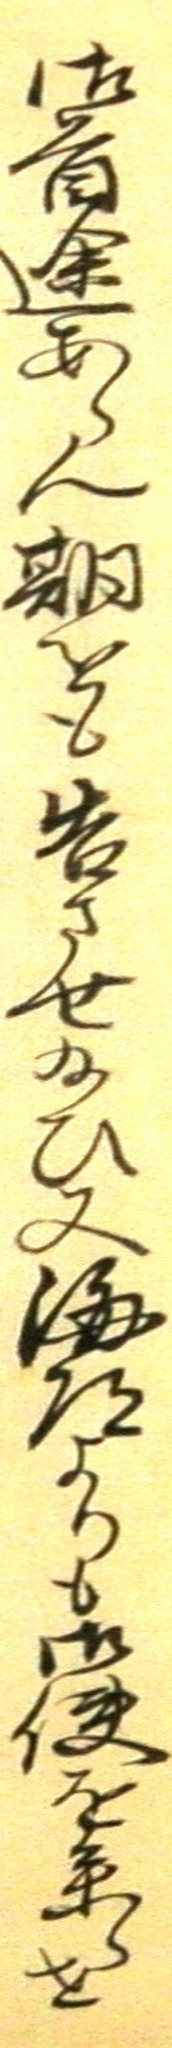御首途あらん期をも告させ給ひ又海道よりも御使を参らせ
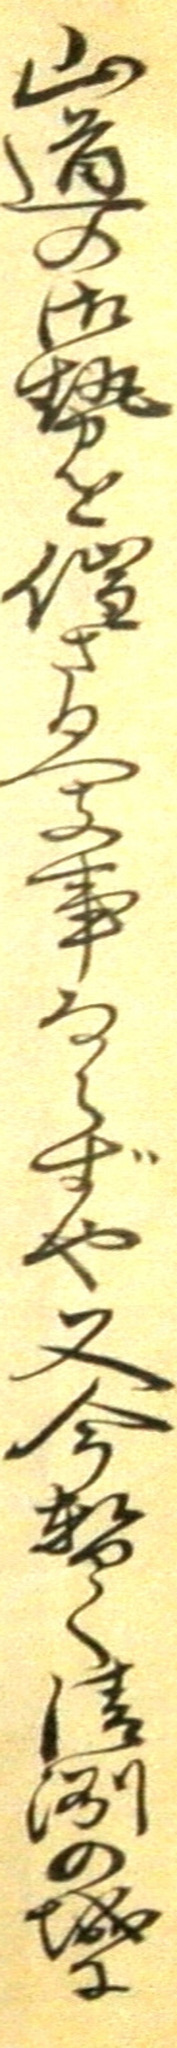山道の御勢を催さるへき事ならずや又今暫く清洲の城に
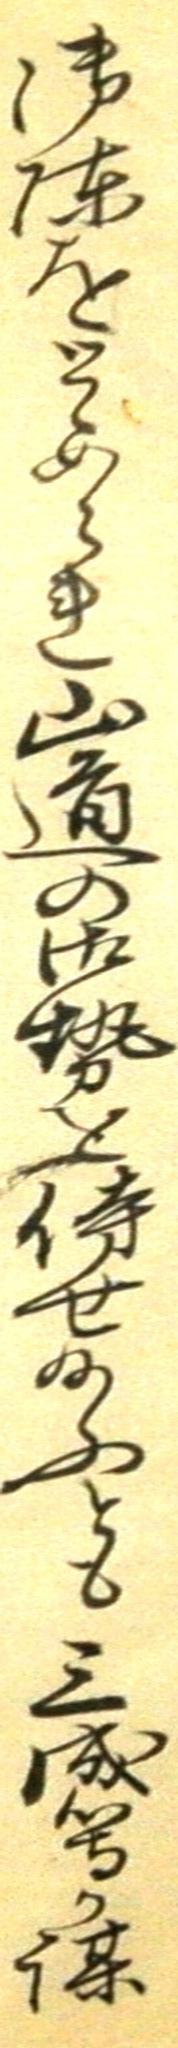御陣をとゝめられ山道の御勢を侍せ給ふとも三成等か謀
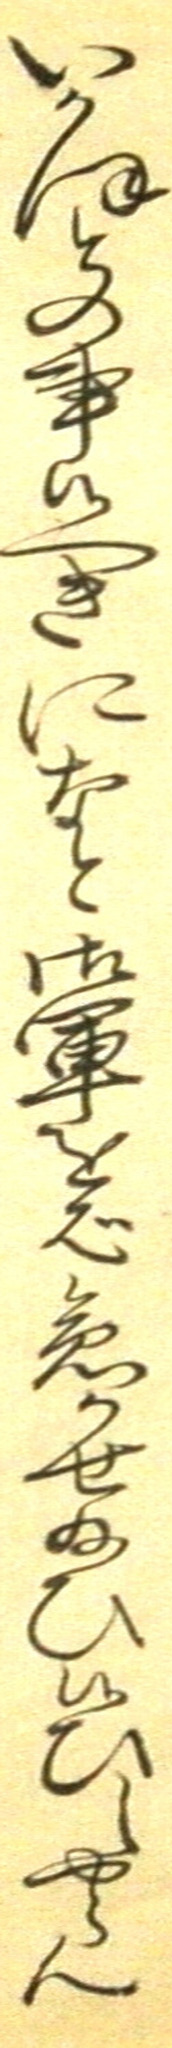いかほとの事候へきになと御軍をば急かせ給ひ候ひしやらん
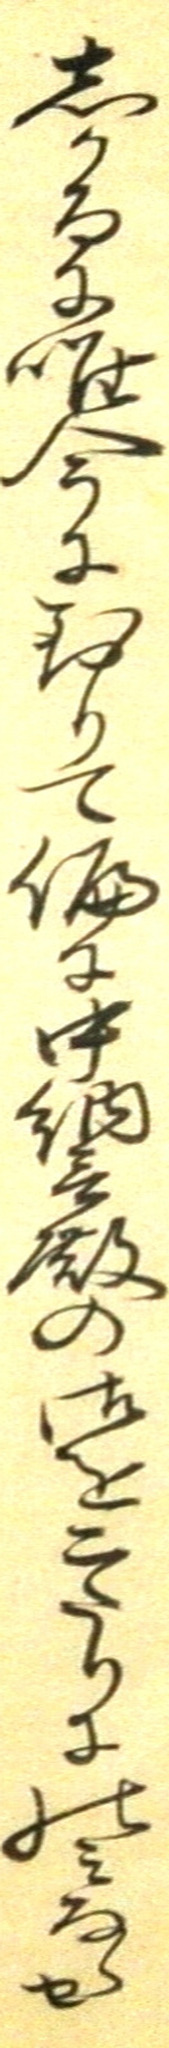しかるに唯今に到りて偏に中納言殿の御をこたりにのみならせ
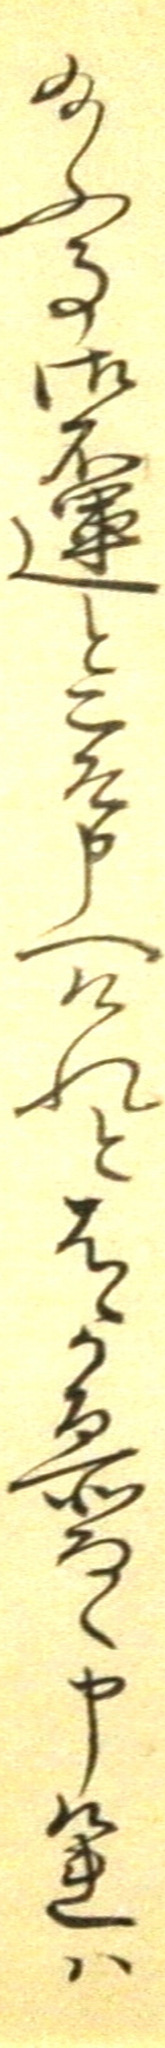給ふ事御不運とこそ申へけれとはゝかる所なく申けれは
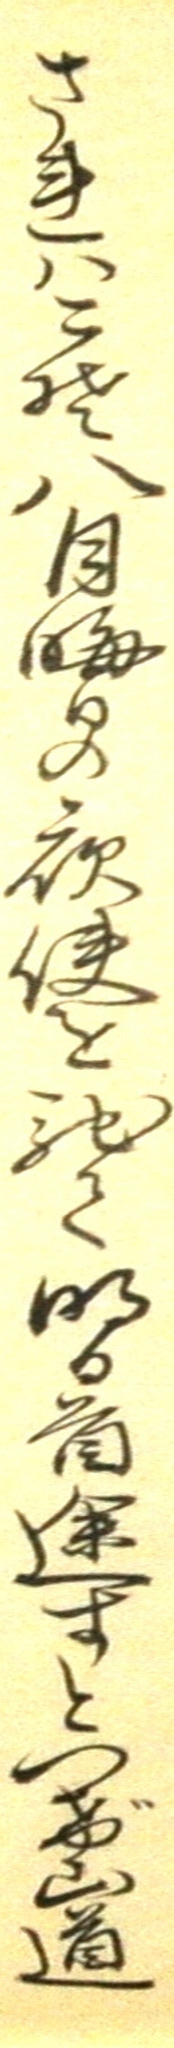されはこそ八月晦日の夜使を馳て明日首途すとつげ山道
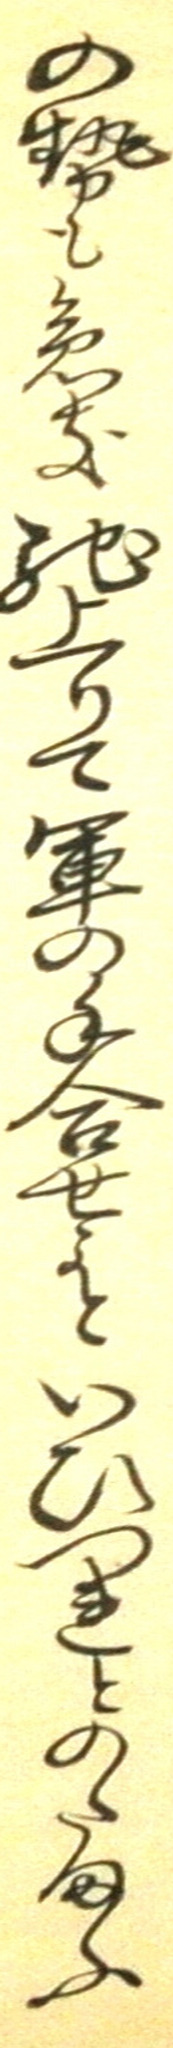の勢も急き馳上りて軍の手合せよといひつれとのたまふ
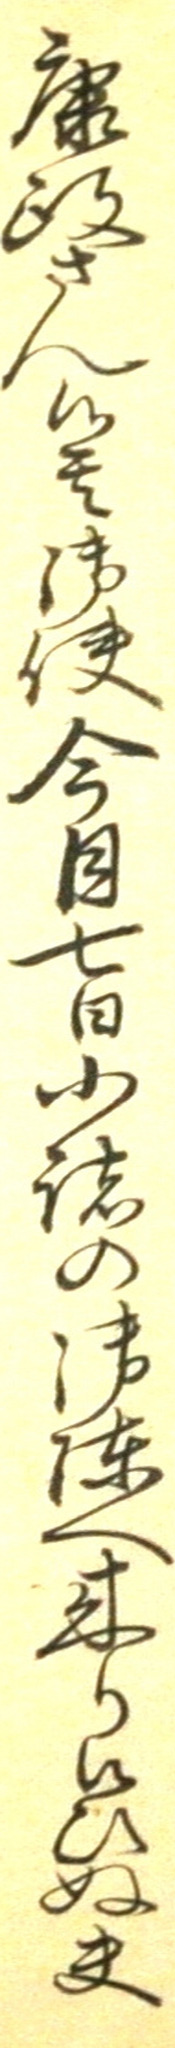康政さん候其御使今月七日小諸の御陣へ来り候ひぬ夫
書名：藩翰譜（四・上）
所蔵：伊那市立高遠町図書館・合同会社AMANE
